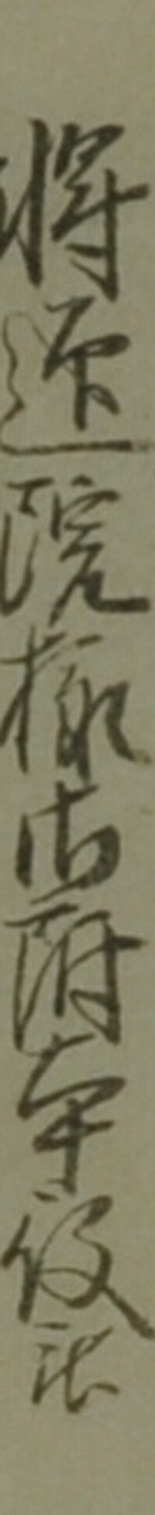将迎院様御附本役被
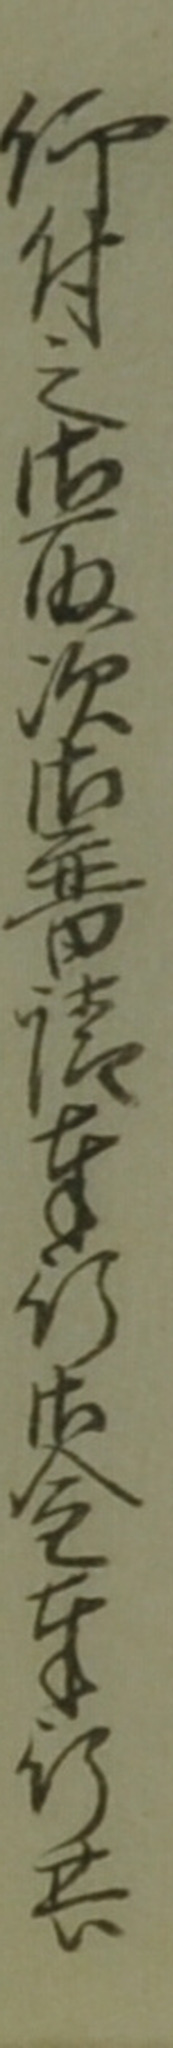仰付之御取次御普請奉行御金奉行共
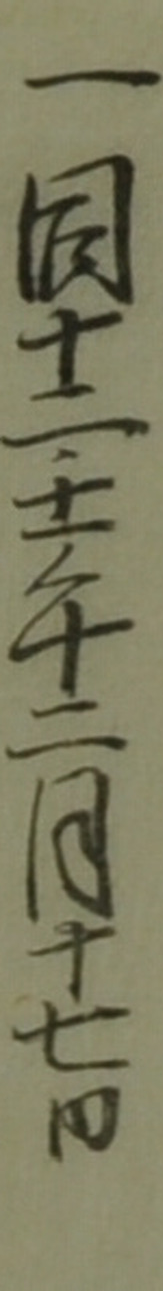一同十二壬午二月十七日
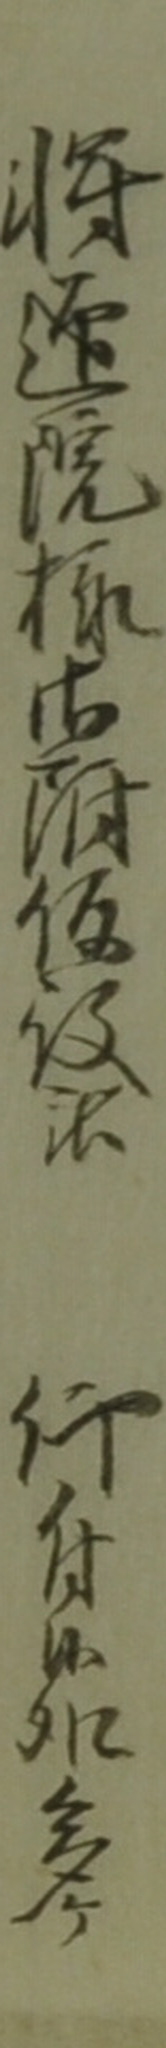将迎院様御附仮役被仰付候処多ヶ
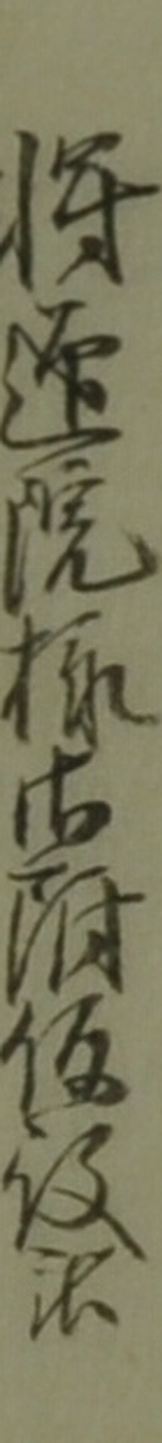将迎院様御附本役被
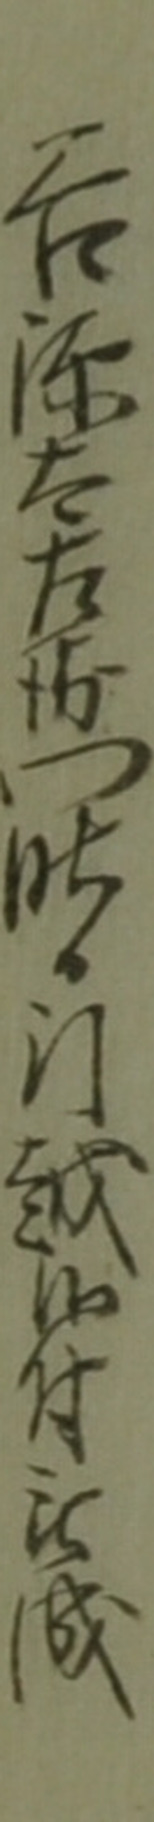谷源太左衛門昨日引越仰付被成
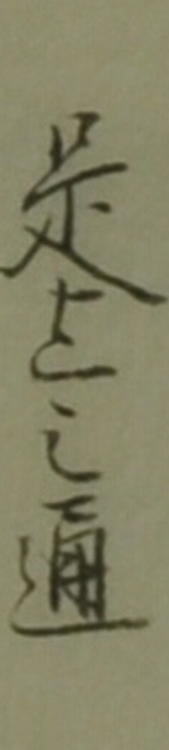是迄之通
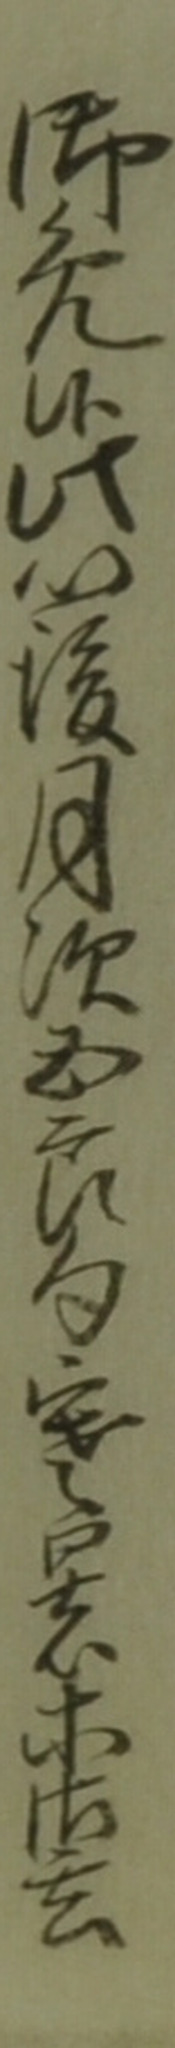御免候此以後月次五節句寒暑等御玄
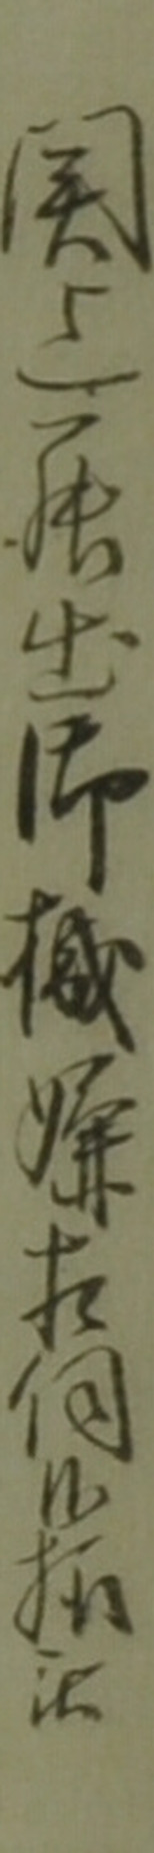関上罷出御機嫌相伺候様被

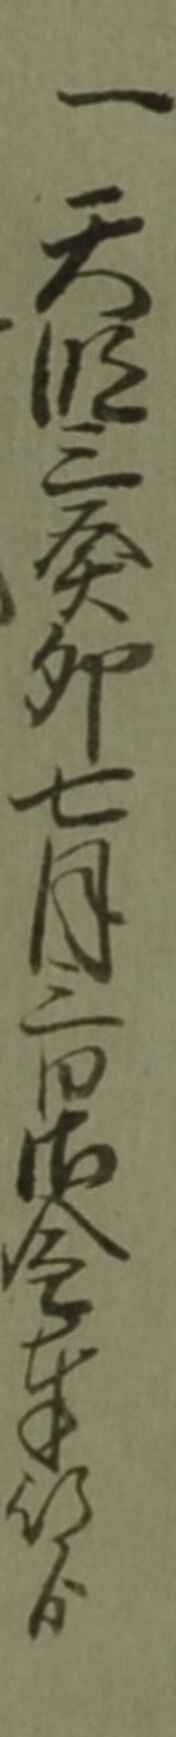一天明三癸卯七月三日御金奉行ゟ
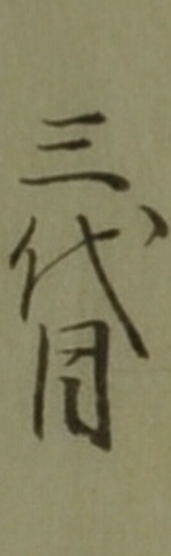三代目
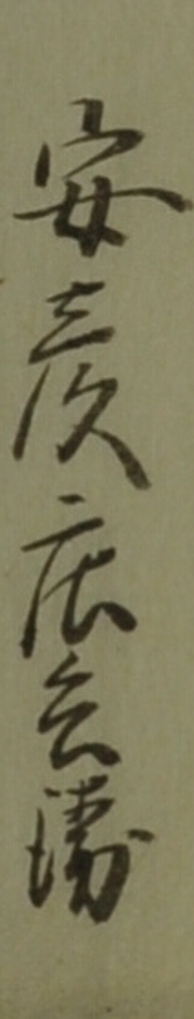安彦庄兵衛
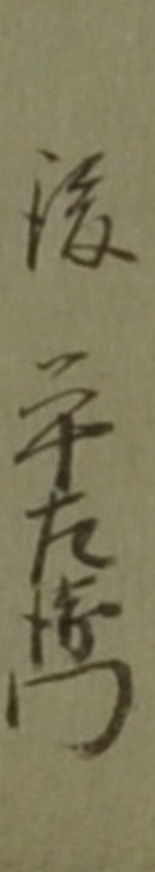後平左衛門
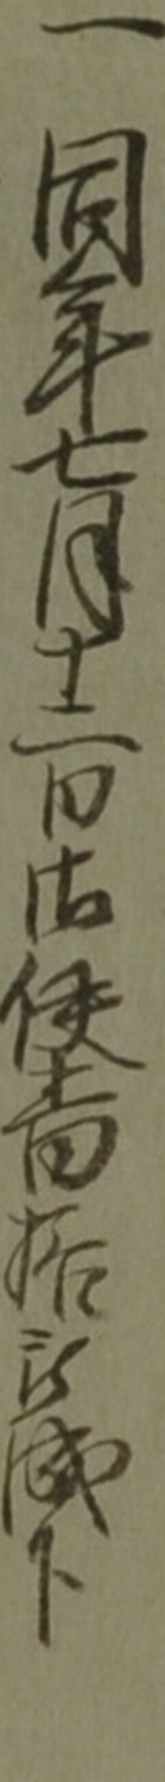一同年七月十二日御使番格被成下
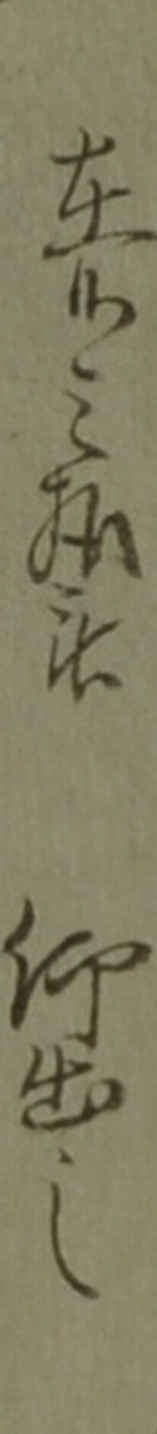在候之様被仰出之
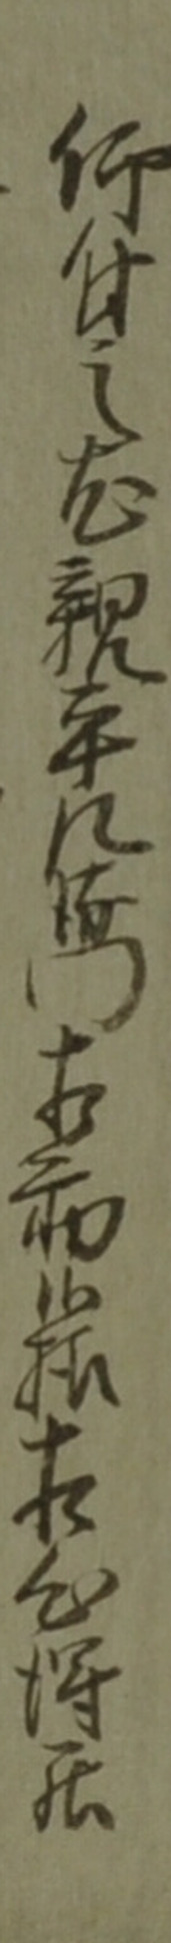仰付之尤親平左衛門相勤候様相心得罷
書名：諸御役代々録（六）
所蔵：伊那市立高遠町図書館・合同会社AMANE
